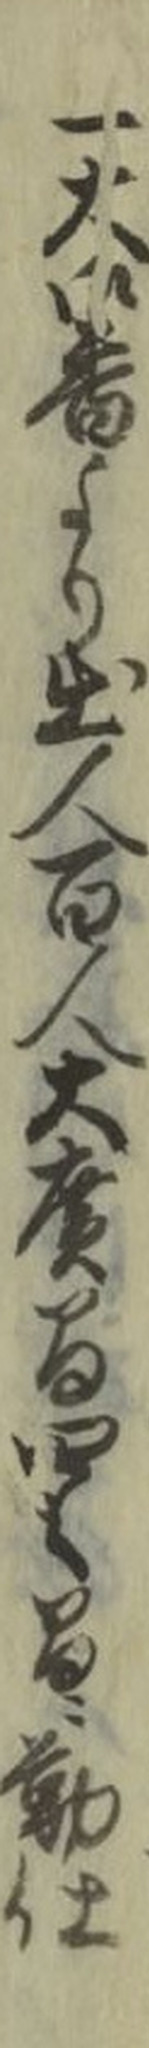一大御番より出人百人大広間四之間に勤仕
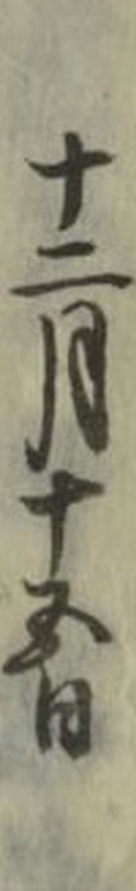十二月十五日
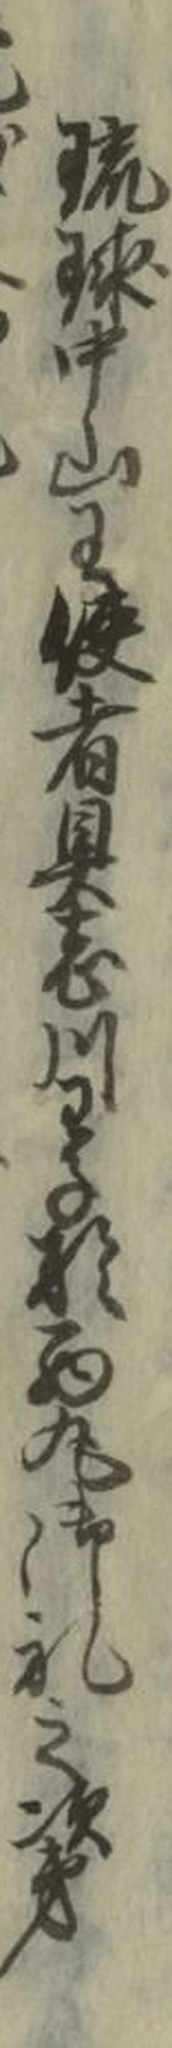琉球中山王使者具志川王子願西丸御礼之次第
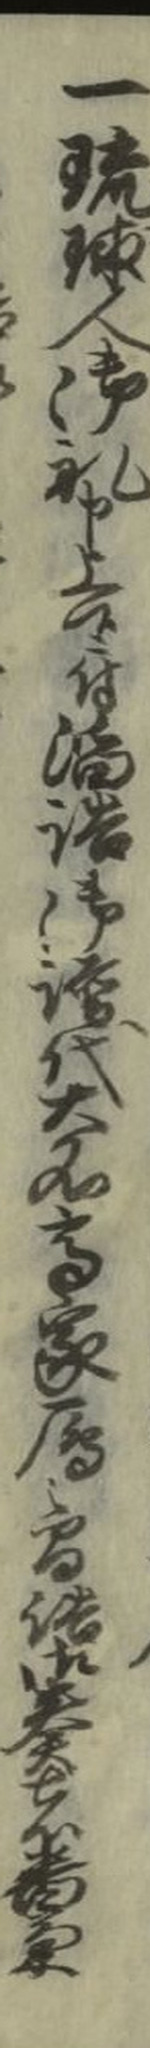一琉球人御礼申上候に付溜詰御譜代大名高家雁之間詰御奏者番菊
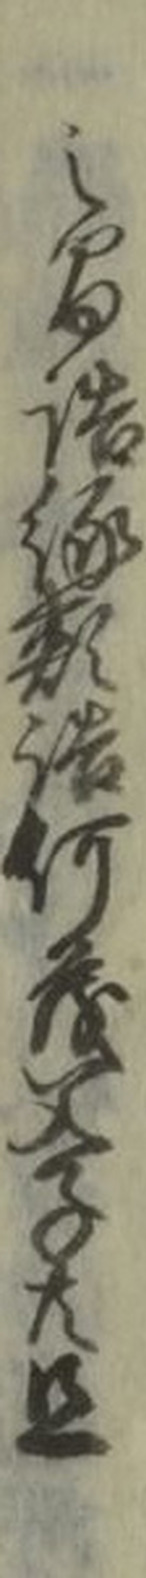之間詰縁類詰何も父子共且
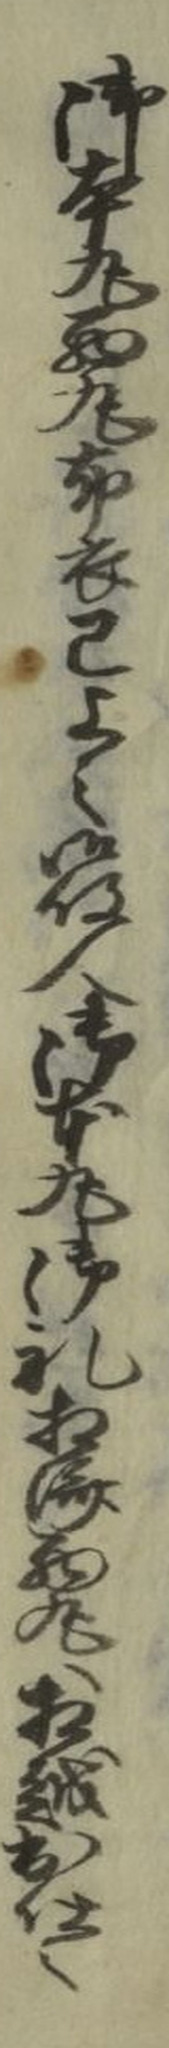御本丸西丸布衣已上之御役人御本丸御礼相済西丸へ相越出仕之

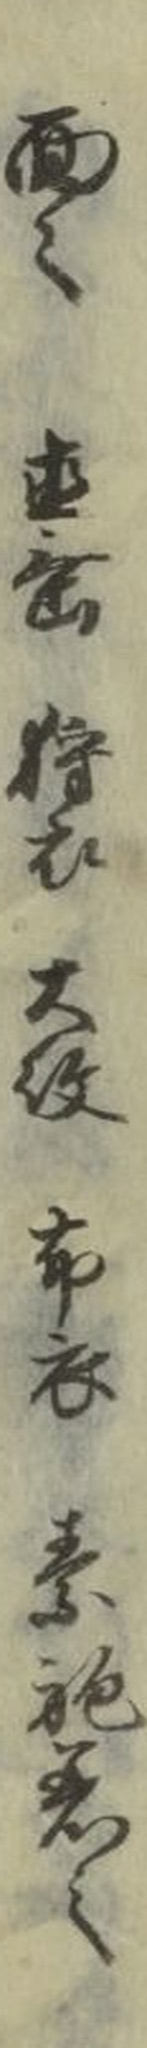面々直垂狩衣大紋布衣素襖着之
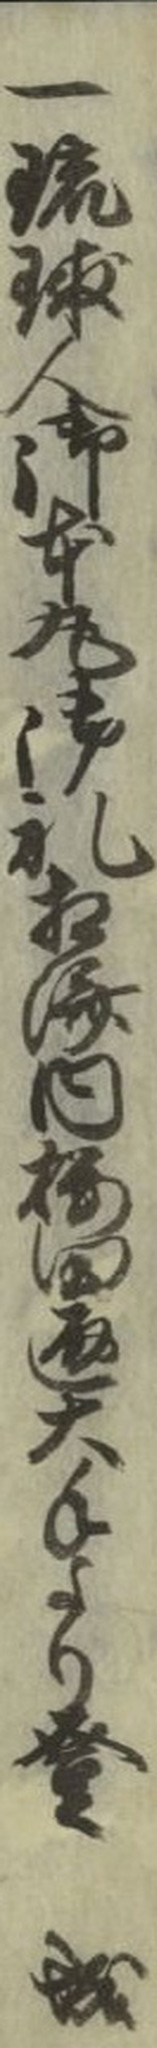一琉球人御本丸御礼相済内桜田通大手より登城
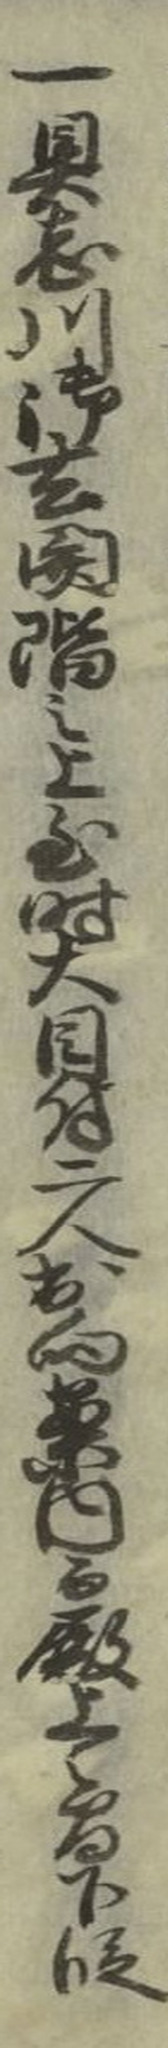一具志川御玄関階之上至時大目付二人出向案内而殿上之間下段
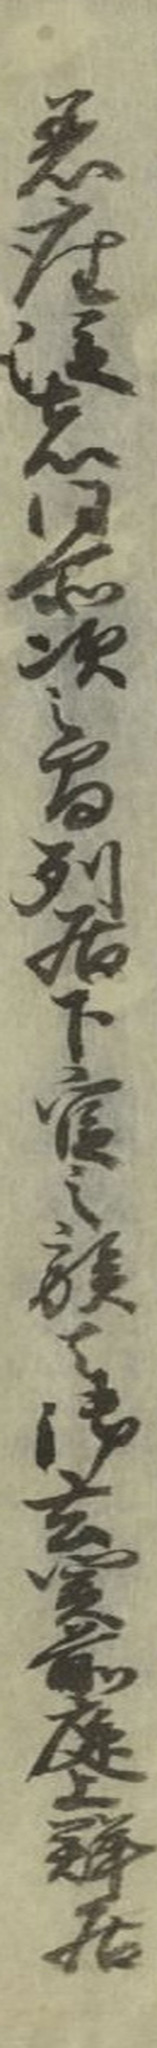着座従者同所次之間列居下官之族は御玄関前庭上群居
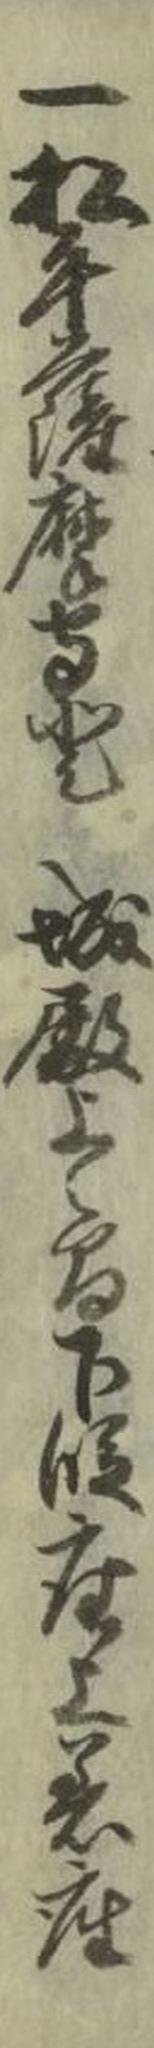一松平薩摩守登城殿上之間下段座上着座
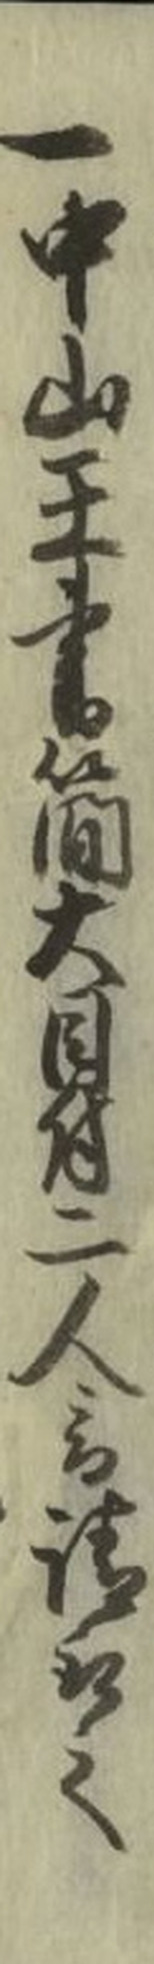一中山王書簡大目付二人に而請取之
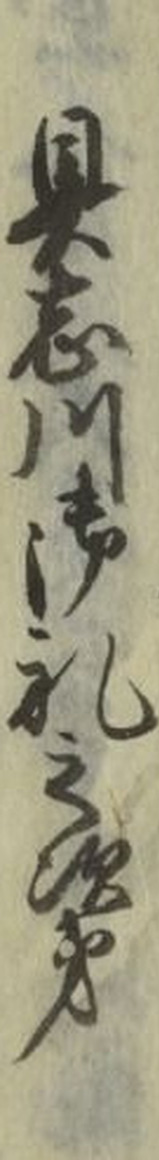具志川御礼之次第
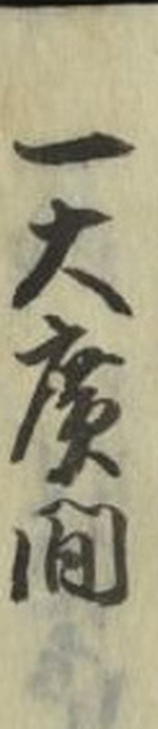一大広間
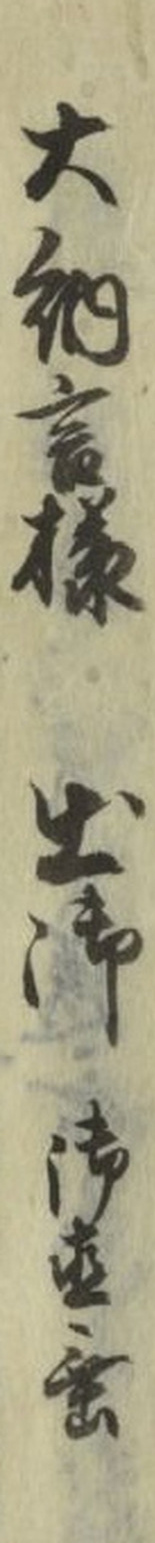大納言様出御御直垂
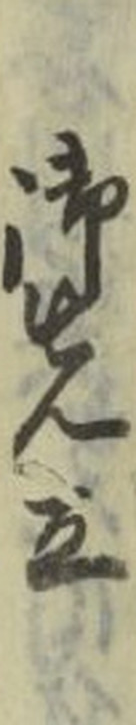御先立
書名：琉球人来朝之記
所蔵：University of the Ryukyus Library
